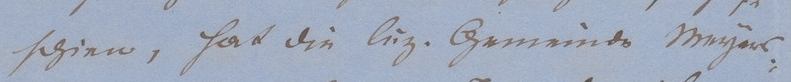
schien, hat die luz. Gemeinde Meyers-
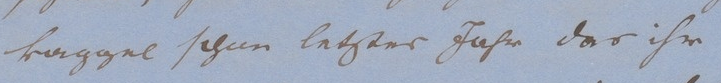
kappel schon letztes Jahr das ihr
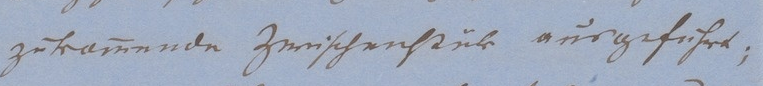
zukommende Zwischenstük ausgeführt;
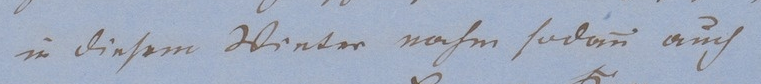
in diesem Winter nahm sodann auch
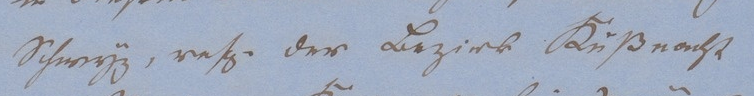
Schwyz, resp. der Bezirk Küßnacht
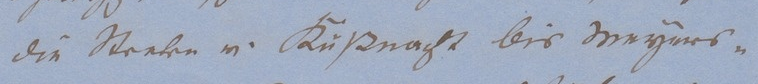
die Streke v. Küßnacht bis Meyers-
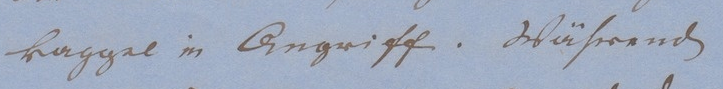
kappel in Angriff. Während
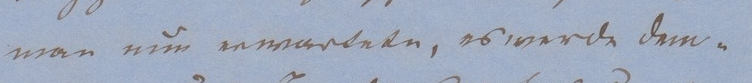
man nun erwartete, es werde dem-
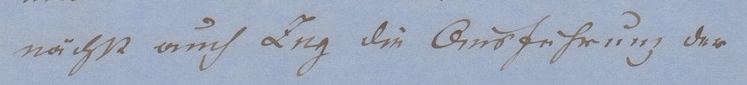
nächst auch Zug die Ausführung der
